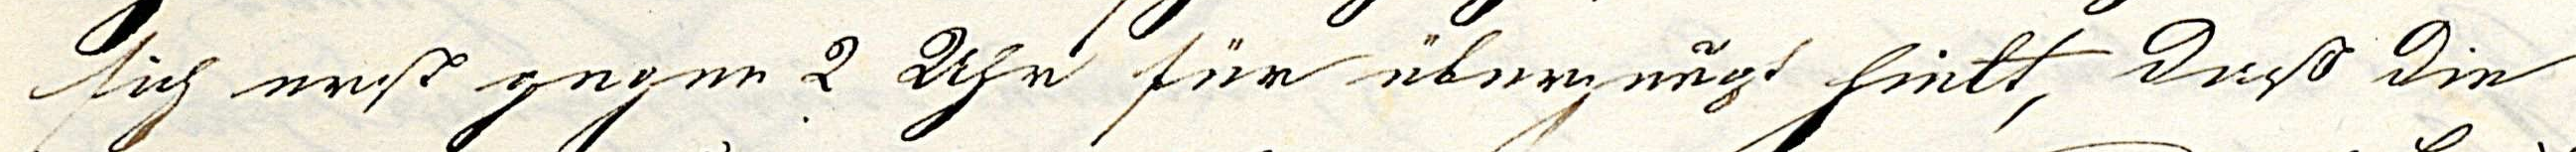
sich erst gegen 2 Uhr für überzeugt hielt, daß die
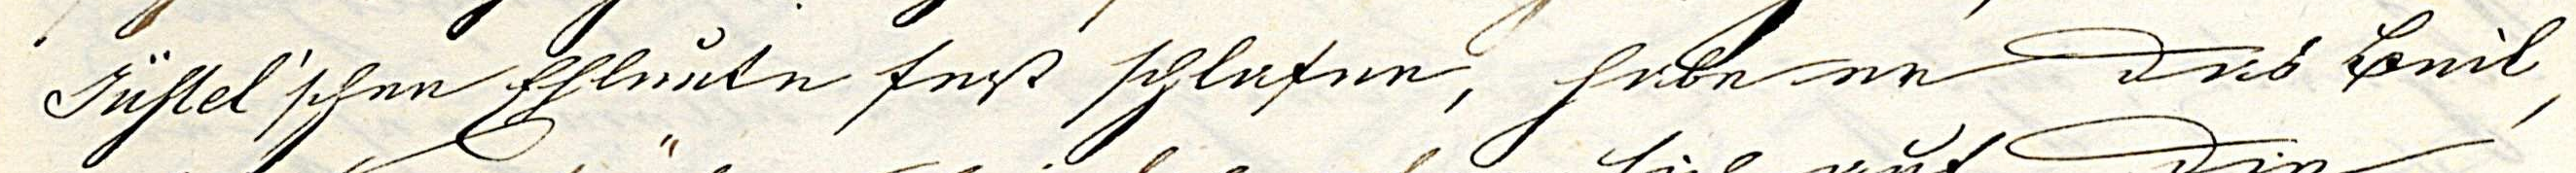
Jüstel’schen Eheleute fest schlafen, habe er das Beil
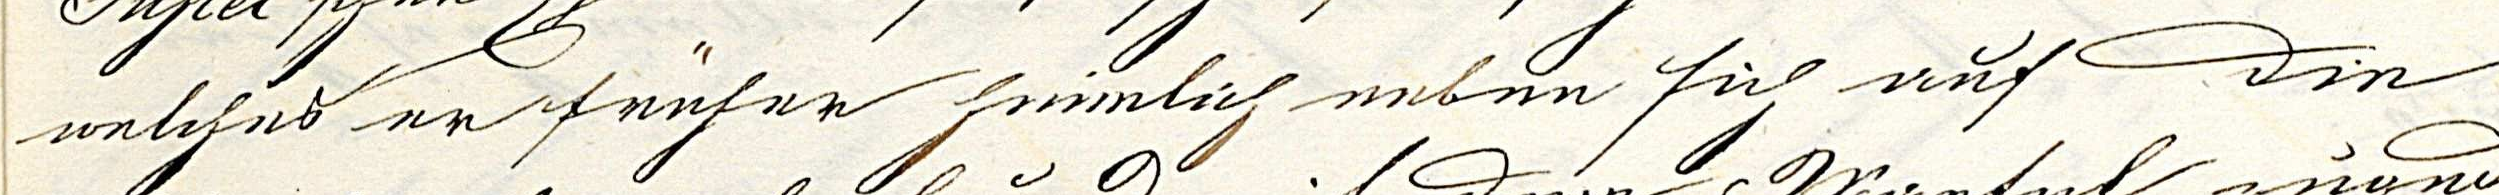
welches er früher heimlich neben sich auf die
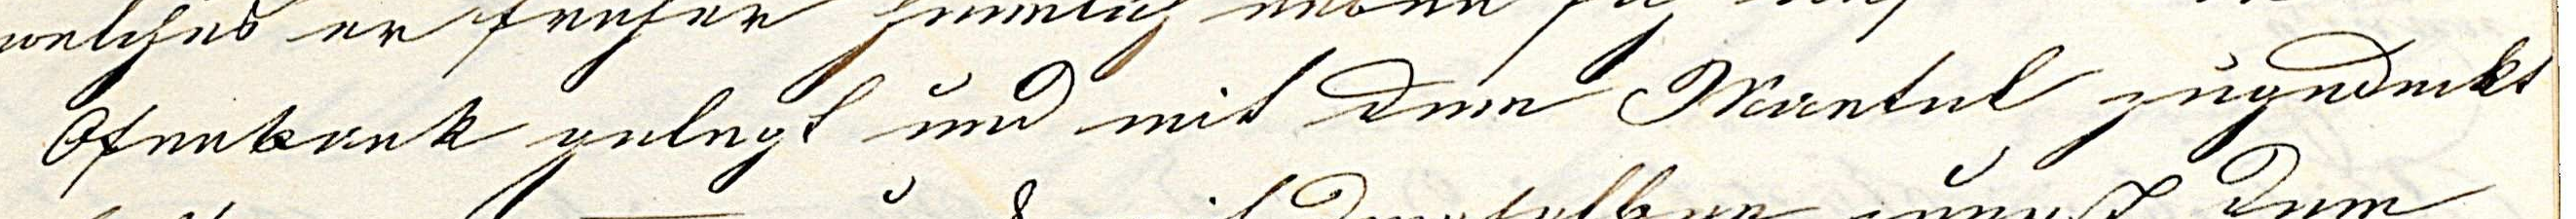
Ofenbank gelegt und mit dem Mantel zugedeckt
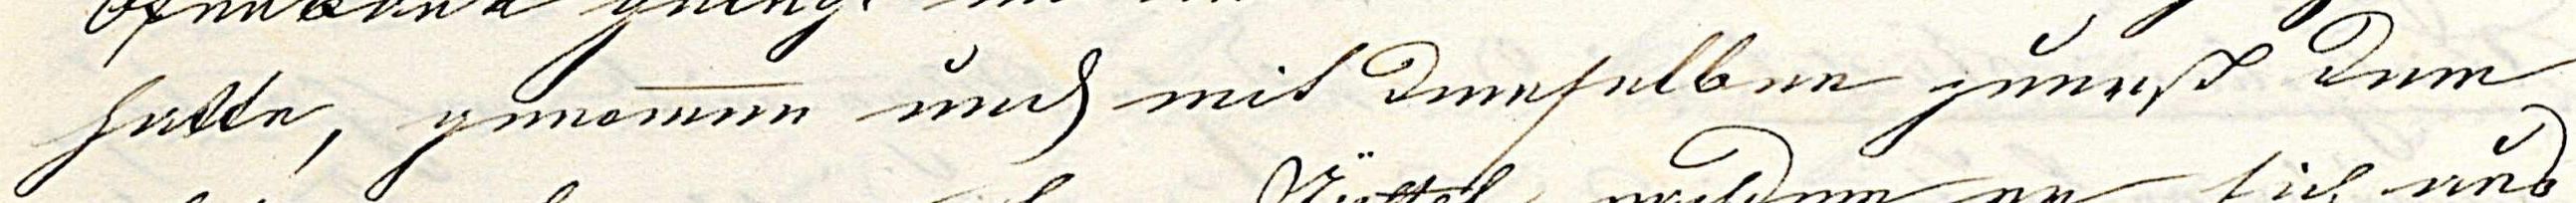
hatte, genommen auch mit demselben zuerst dem
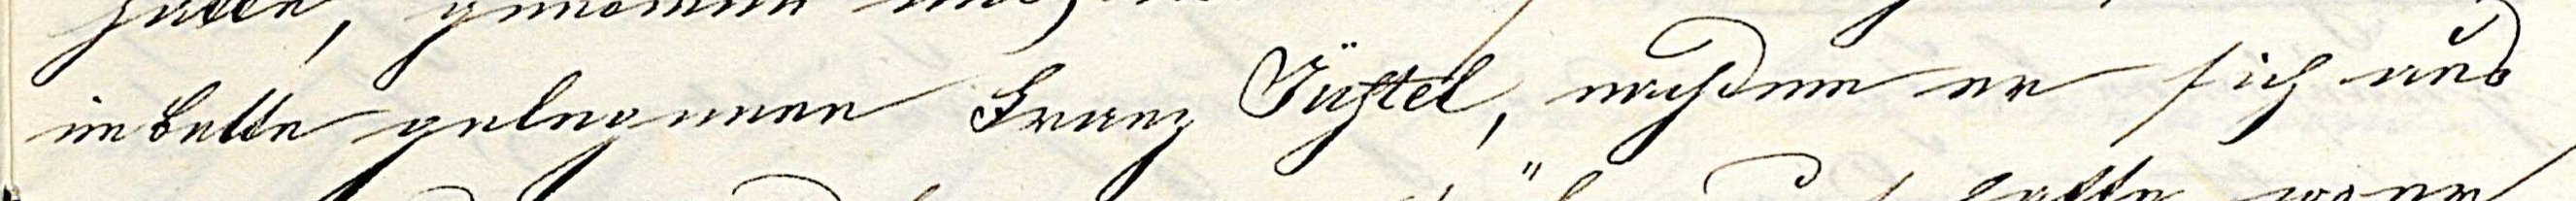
im Bette gelegenen Franz Jüstel, nachdem er sich aus
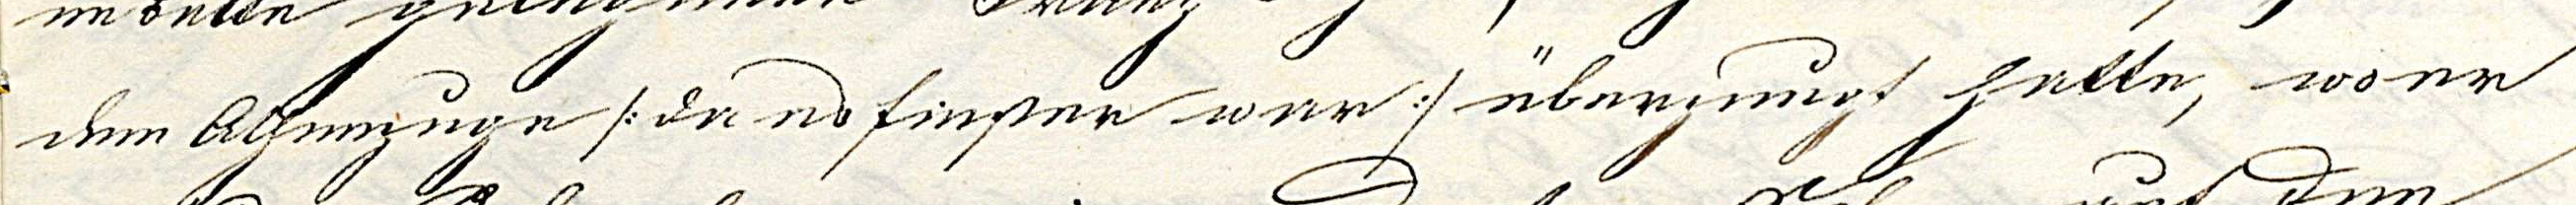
dem Athemzuge (da es finster war) überzeugt hatte, wo er
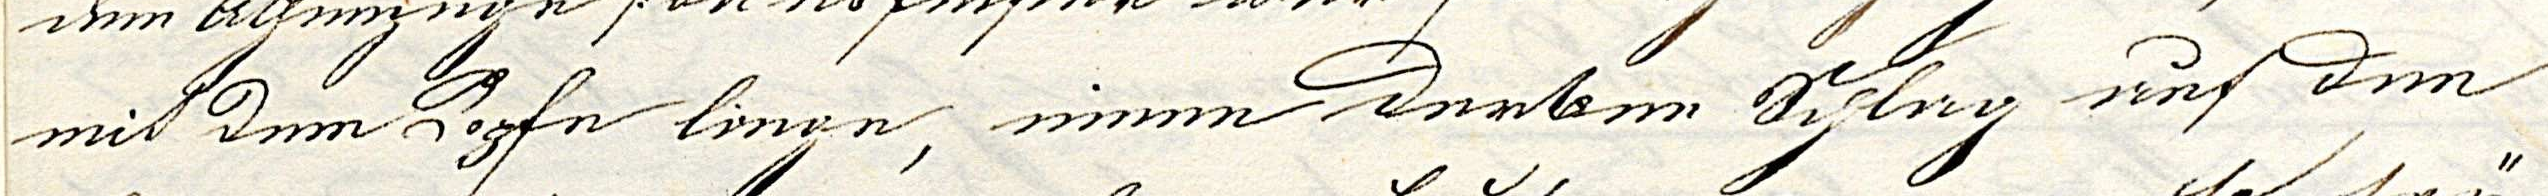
mit dem Kopfe liege, einen derben Schlag auf dem
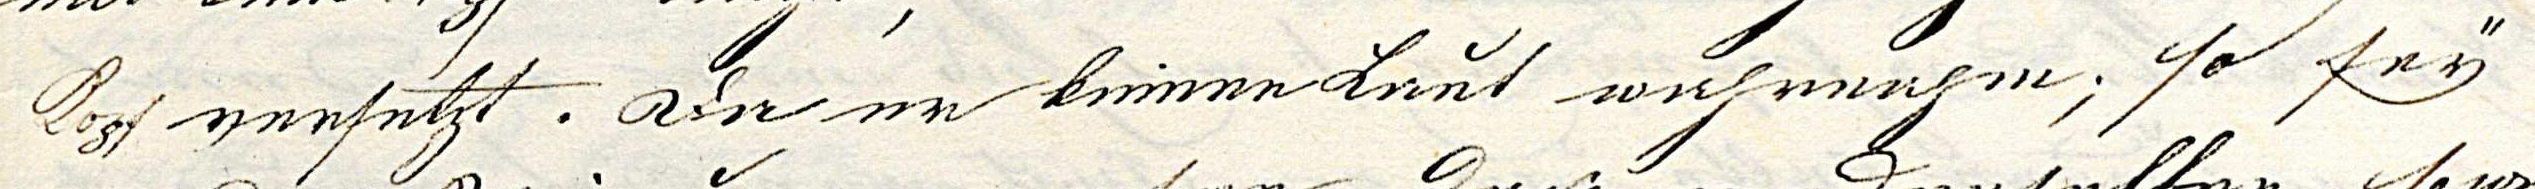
Kopf versetzt. Da er keinen Laut wahrnahm; so sey
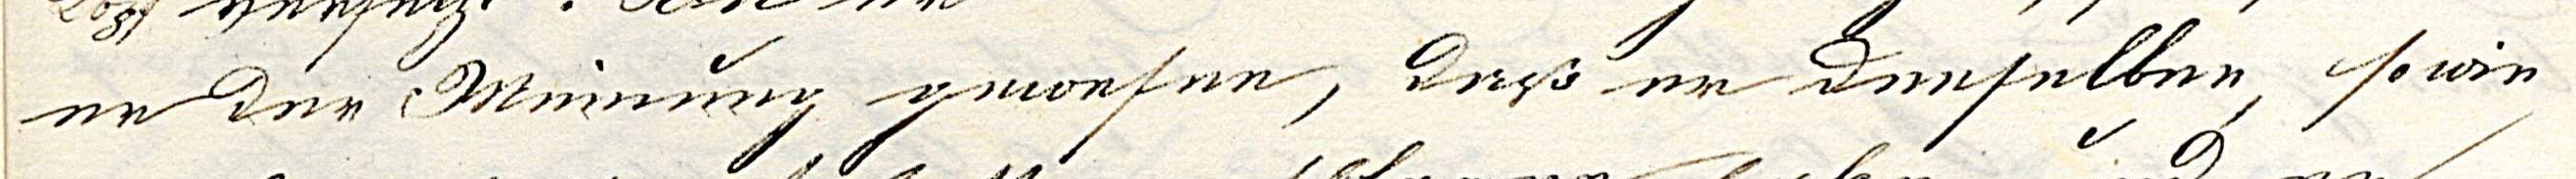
er der Meinung gewesen, daß er demselben, sowie
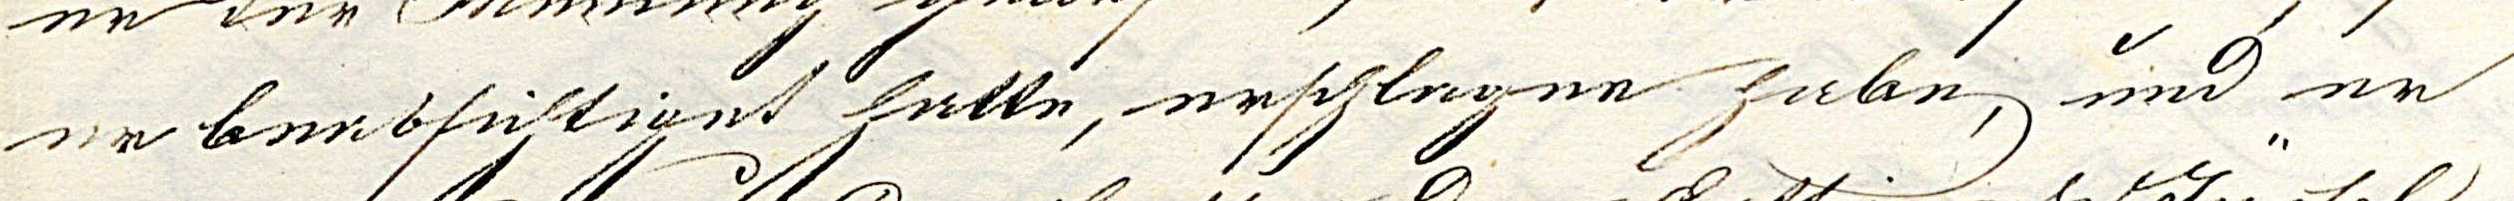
er beabsichtiget hatte, erschlagen habe, und er
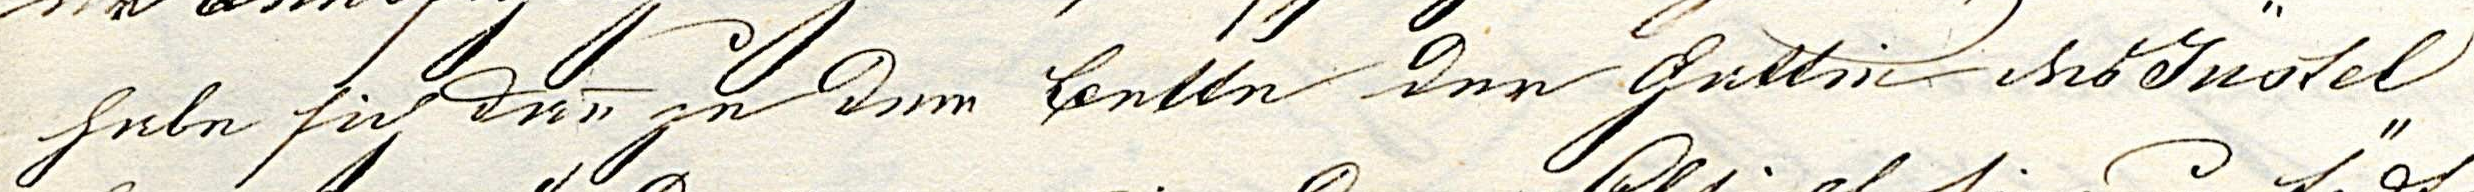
habe sich denn zu dem Bette der Gattin des Jüstel
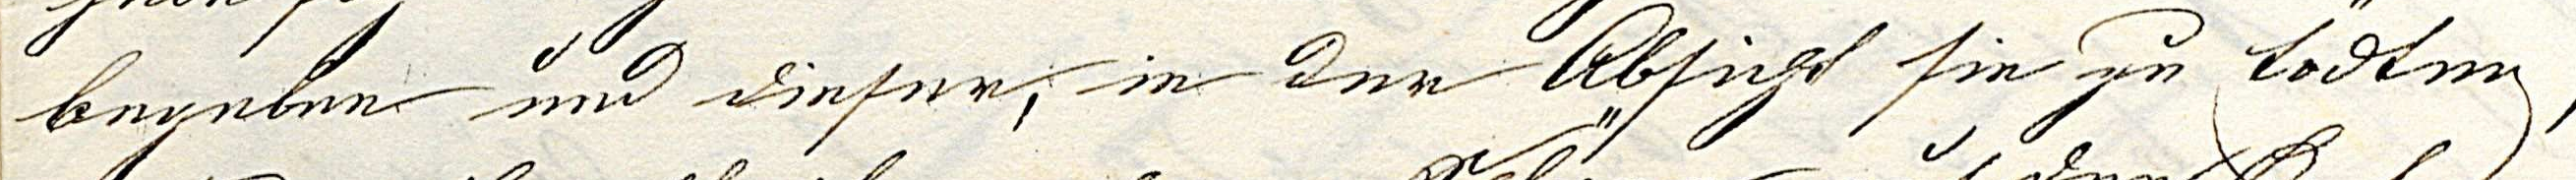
begeben und dieser, in der Absicht sie zu tödten,
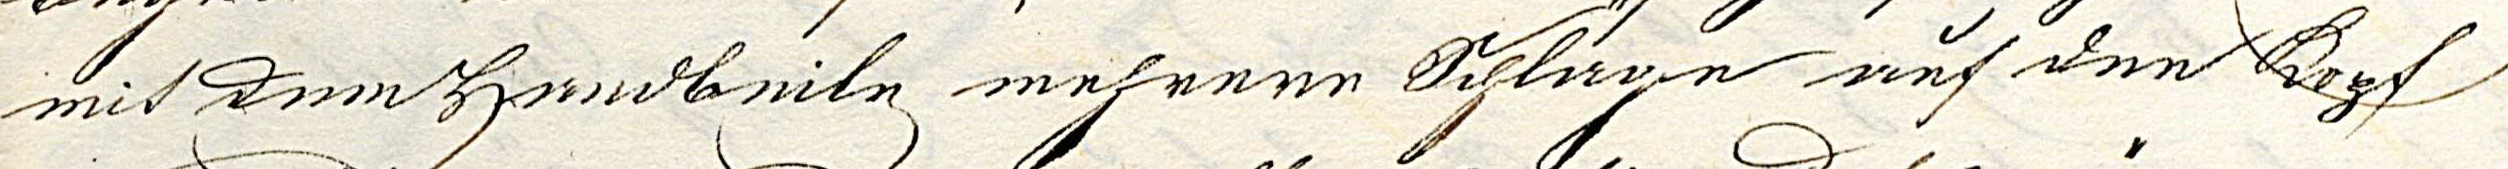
mit dem Handbeile mehrere Schläge auf den Kopf
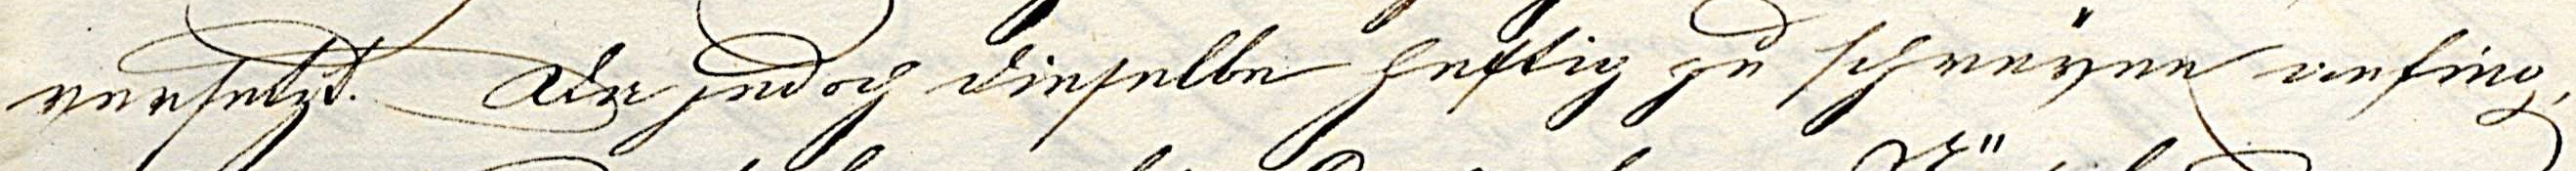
versetzt. Da jedoch dieselbe heftig zu schreyen anfing,
